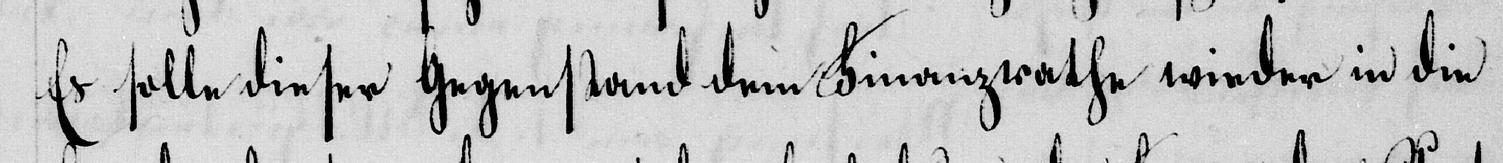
Es solle dieser Gegenstand dem Finanzrathe wieder in die
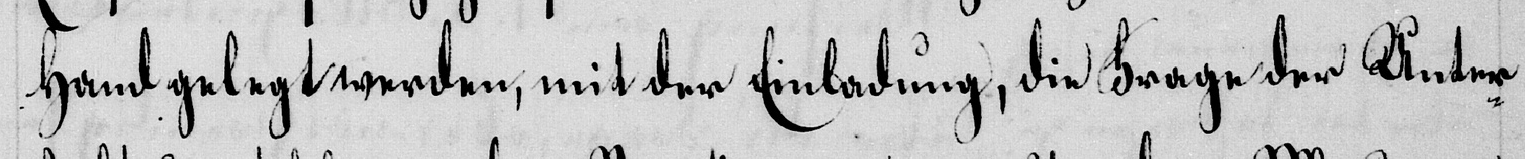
Hand gelegt werden, mit der Einladung, die Frage der Unter¬
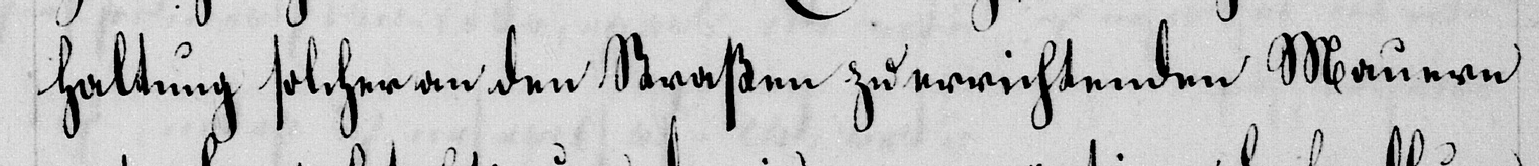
haltung solcher an den Straßen zu errichtenden Mauern
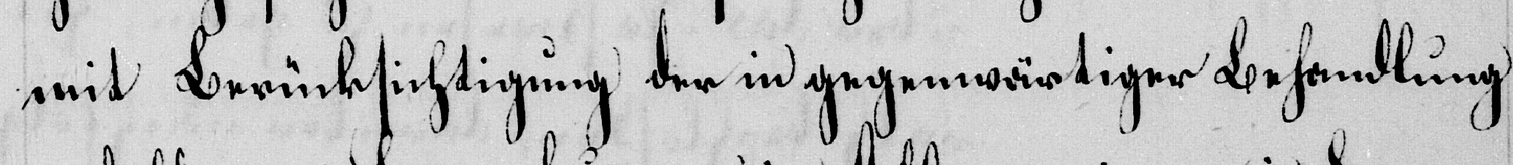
mit Berücksichtigung der in gegenwärtiger Behandlung
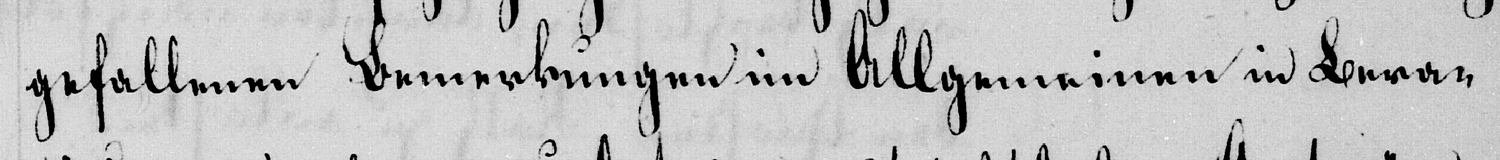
gefallenen Bemerkungen im Allgemeinen in Bera¬
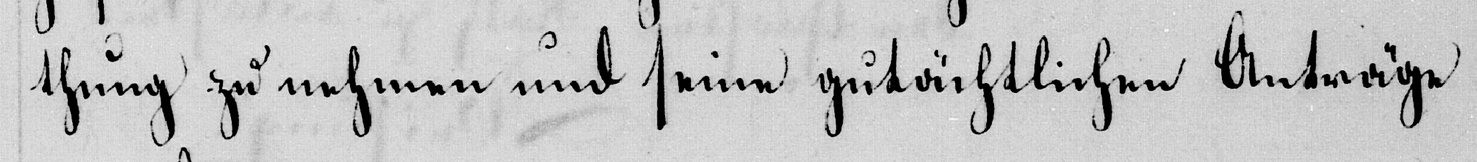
thung zu nehmen und seine gutächtlichen Anträge
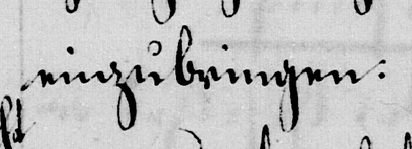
einzubringen.
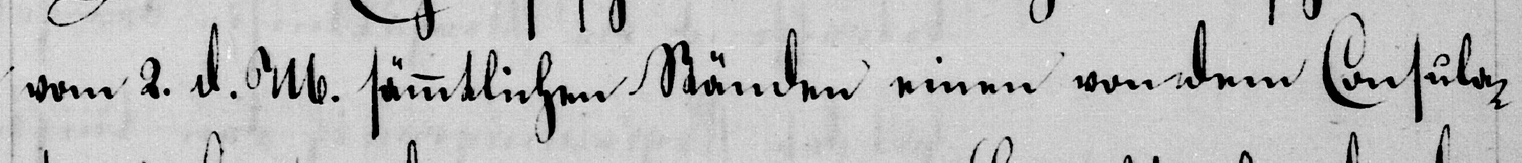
vom 2. d. M. sämmtlichen Ständen einen von dem Consula¬
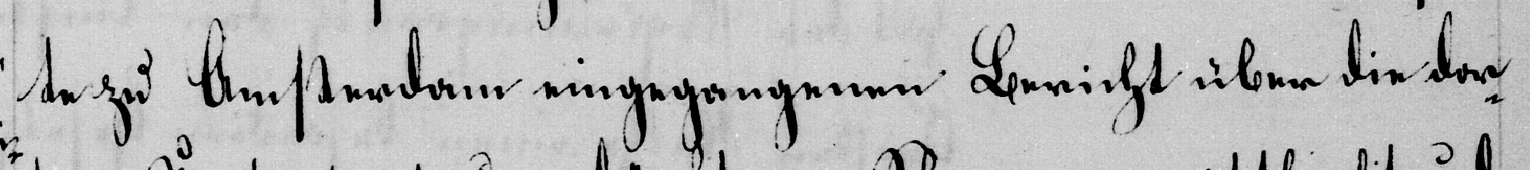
te zu Amsterdam eingegangenen Bericht über die dor¬
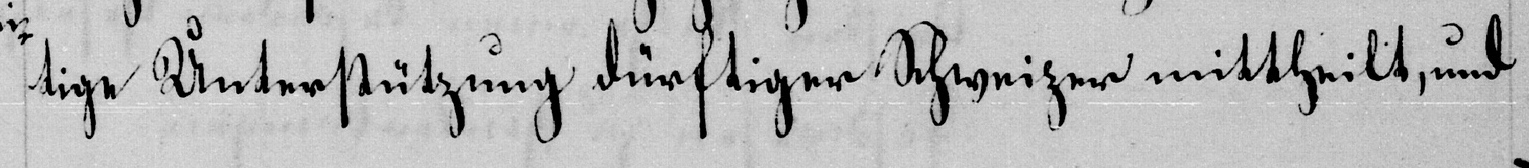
tige Unterstützung dürftiger Schweizer mittheilt, und
